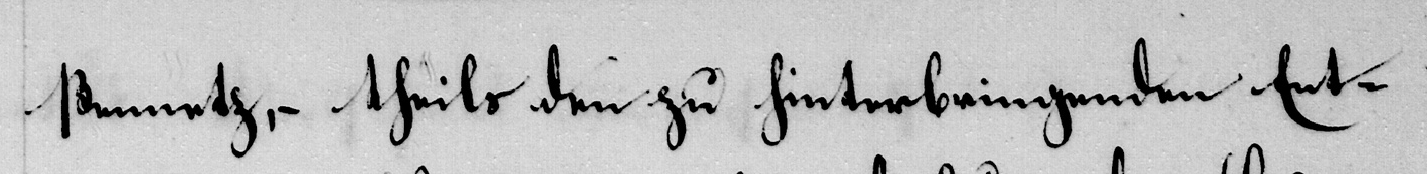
ßennetz, – theils den zu hinterbringenden Ent¬
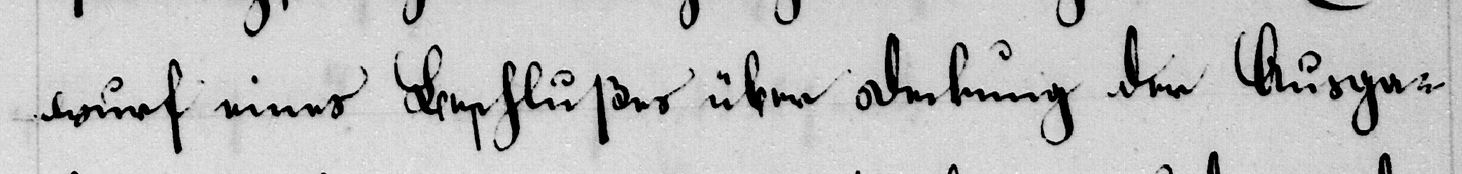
wurf eines Beschlußes über Deckung der Ausga¬
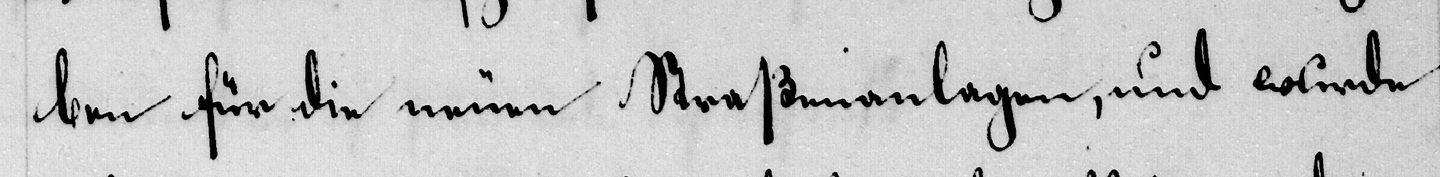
ben für die neuen Straßenanlagen, und wurde
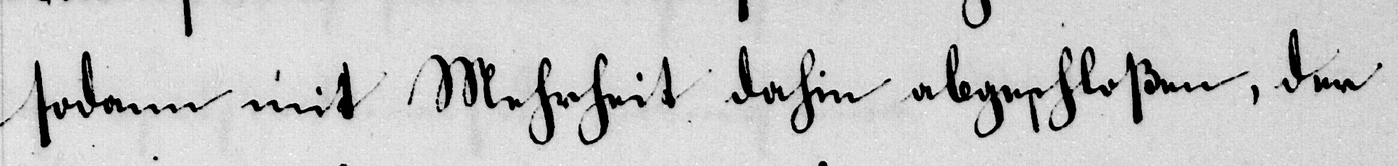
sodann mit Mehrheit dahin abgeschloßen, der
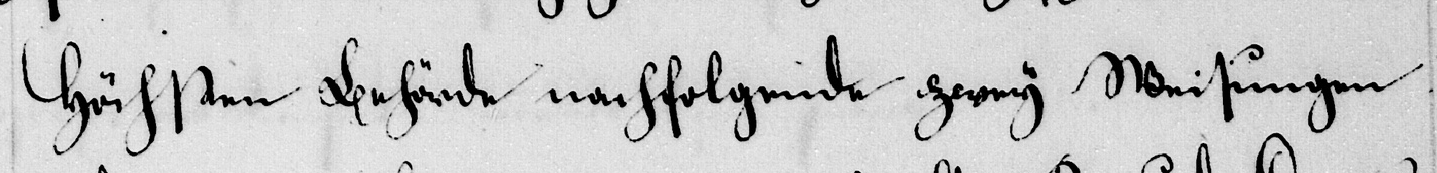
Höchsten Behörde nachfolgende zwey Weisungen
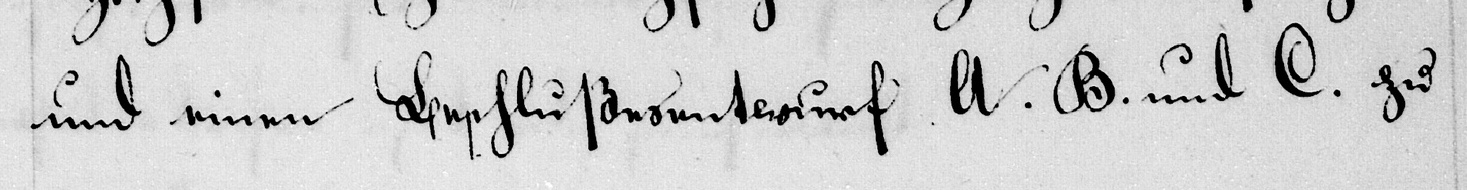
und einen Beschlußesentwurf A. B. und C. zu
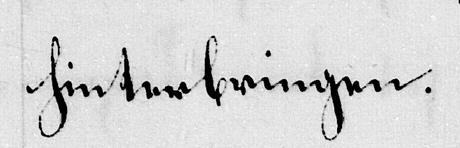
hinterbringen.
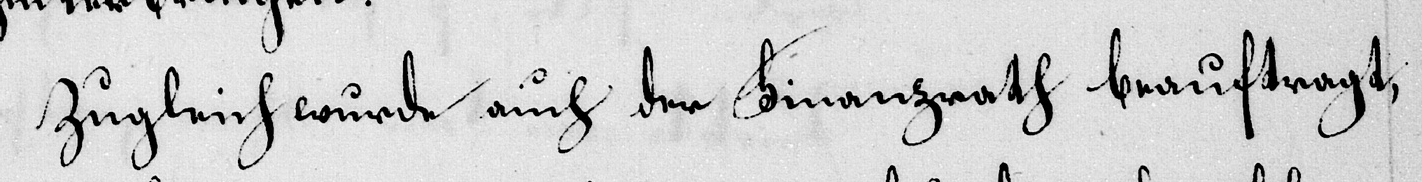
Zugleich wurde auch der Finanzrath beauftragt,
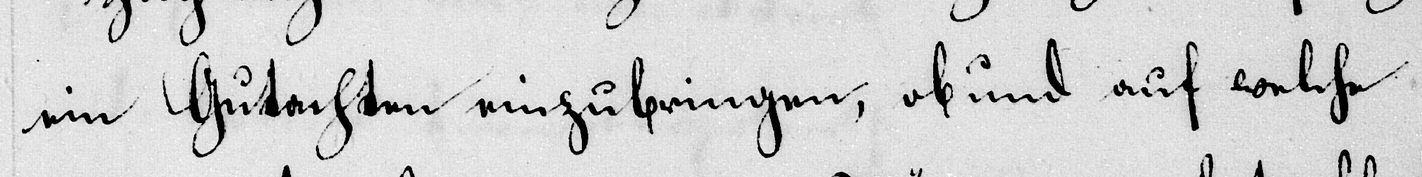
ein Gutachten einzubringen, ob und auf welche
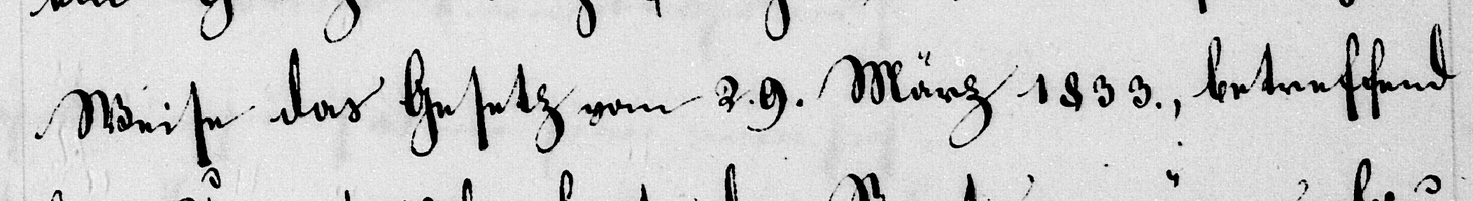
Weise das Gesetz vom 29. März 1833., betreffend
